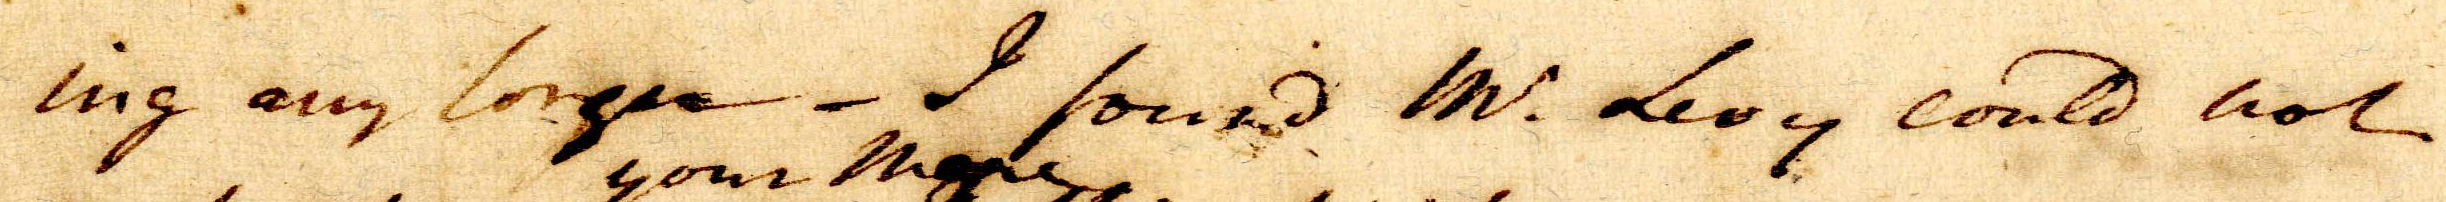-ing any longer. I found M^r. Levy could not
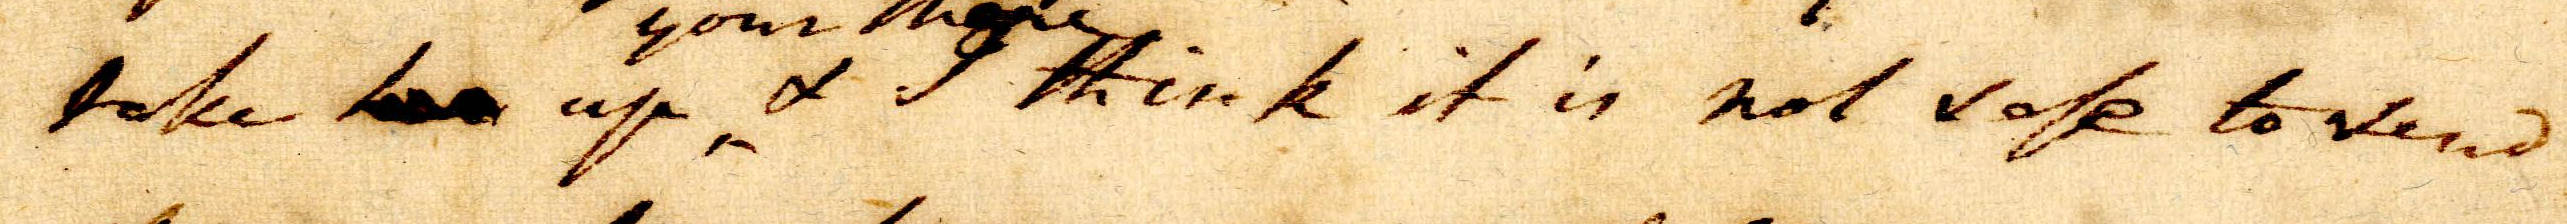take her up ^ & I think it is not safe to send
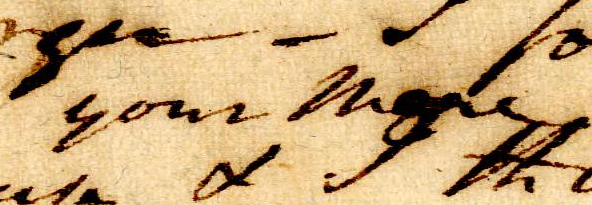your mare
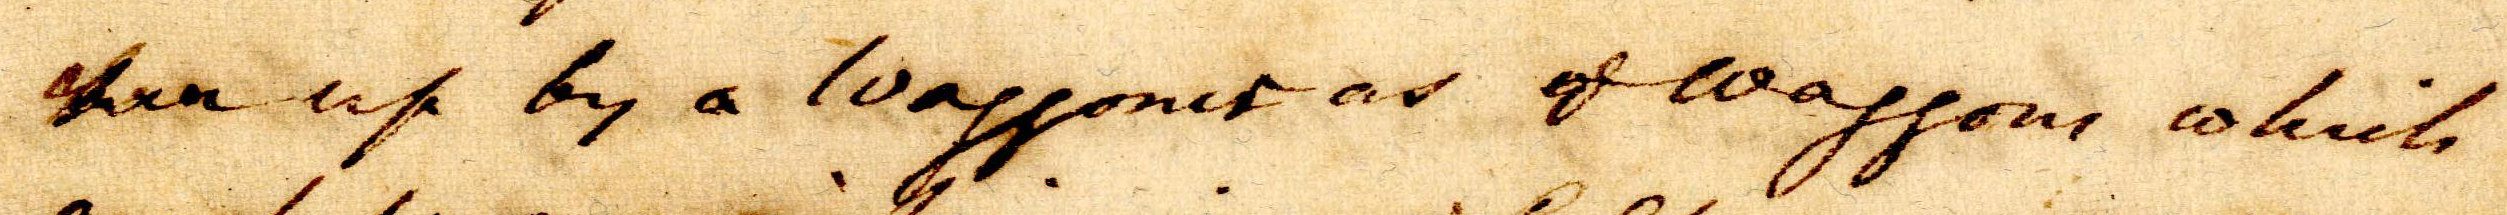her up by a Waggoner as y^e Waggons which
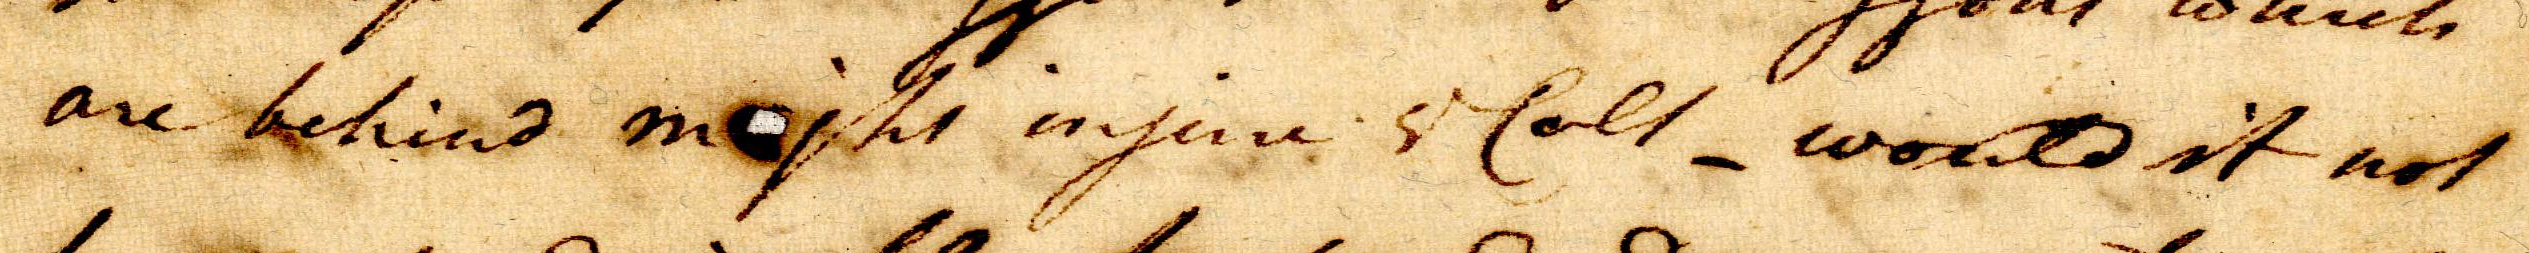are behind might injure y^e Colt- would it not
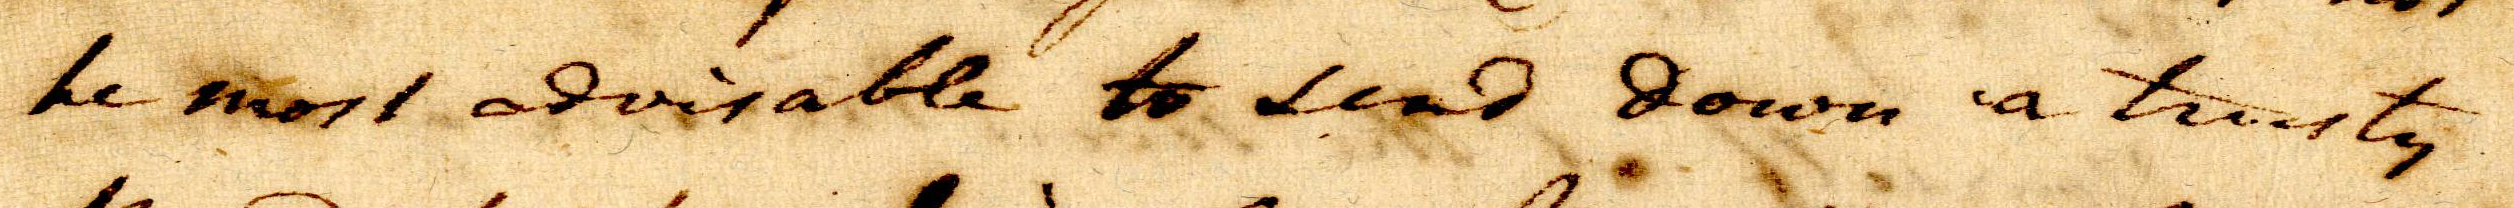be most advisable to send down a trusty
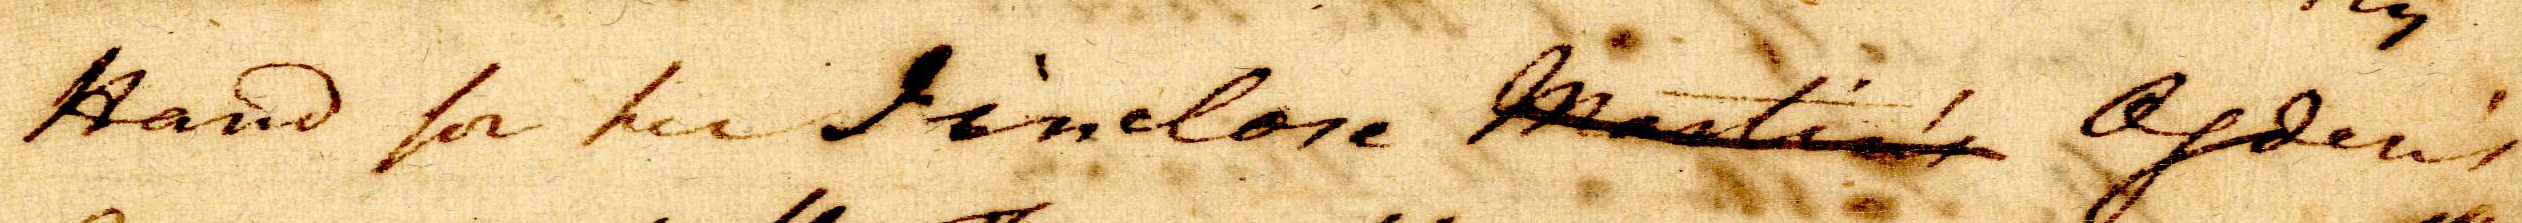Hand for her I inclose Martin's Ogden's
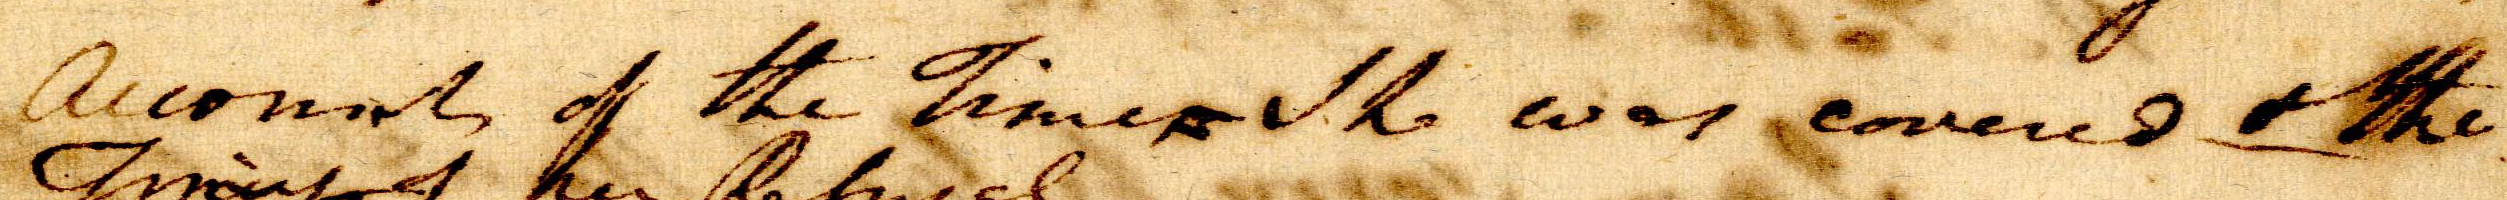Account of the Time. She was covered & the
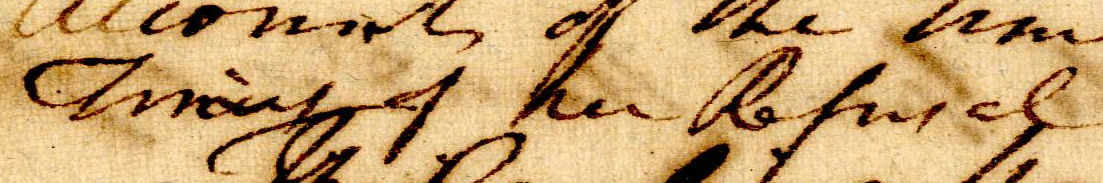Times of her Refusal
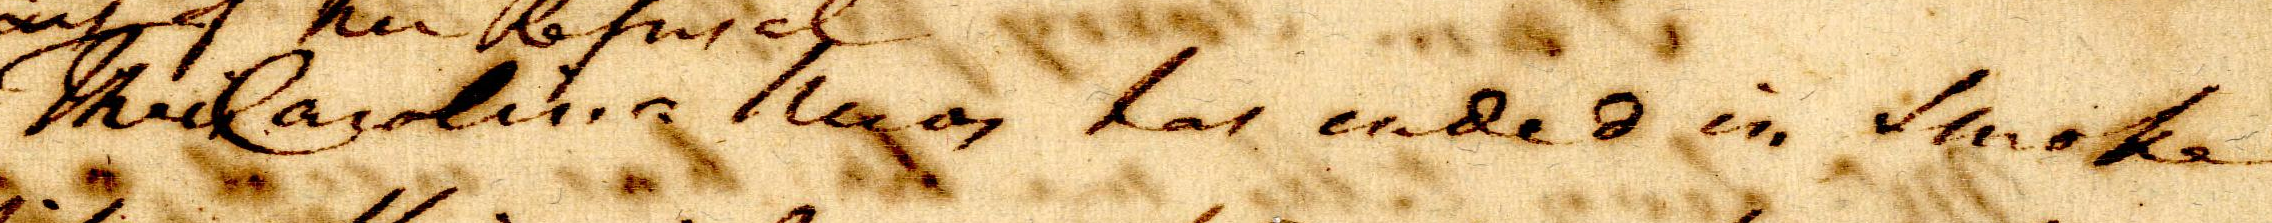Their Carolina Reads has ended in Smoke
